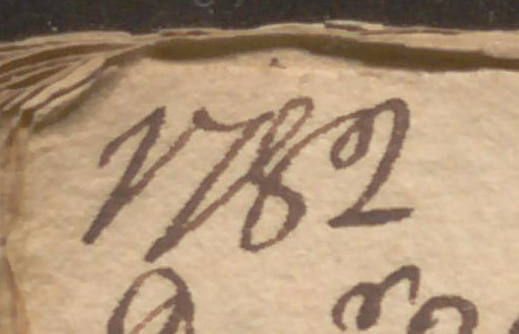1782
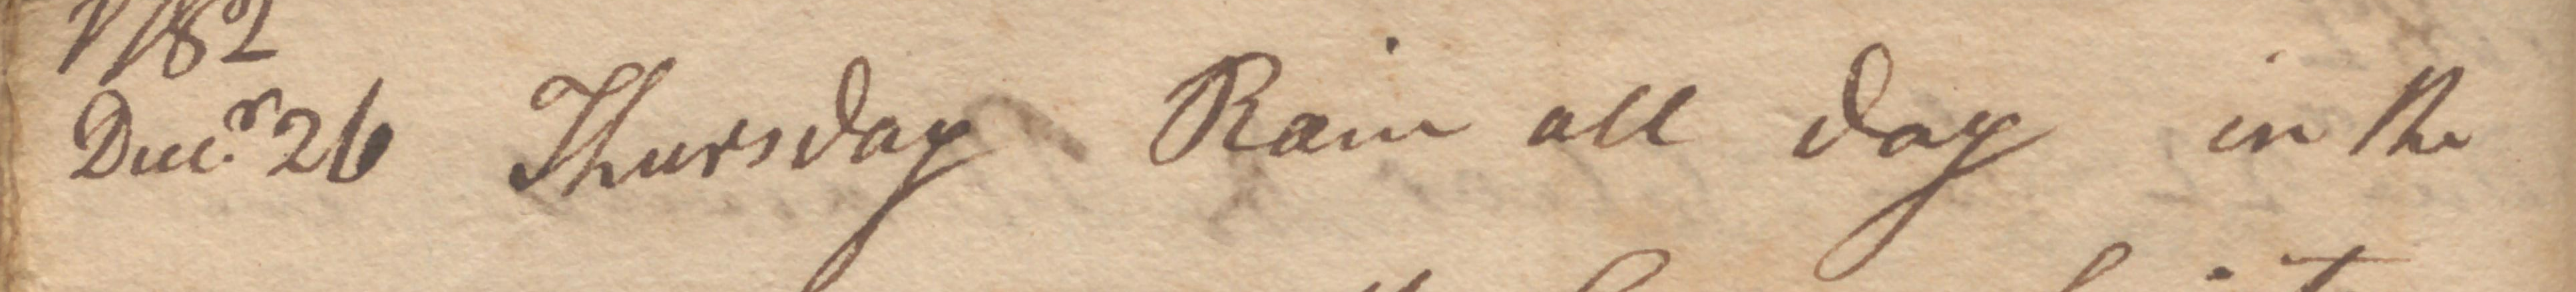Dec^r. 26 Thursday Rain all day in the
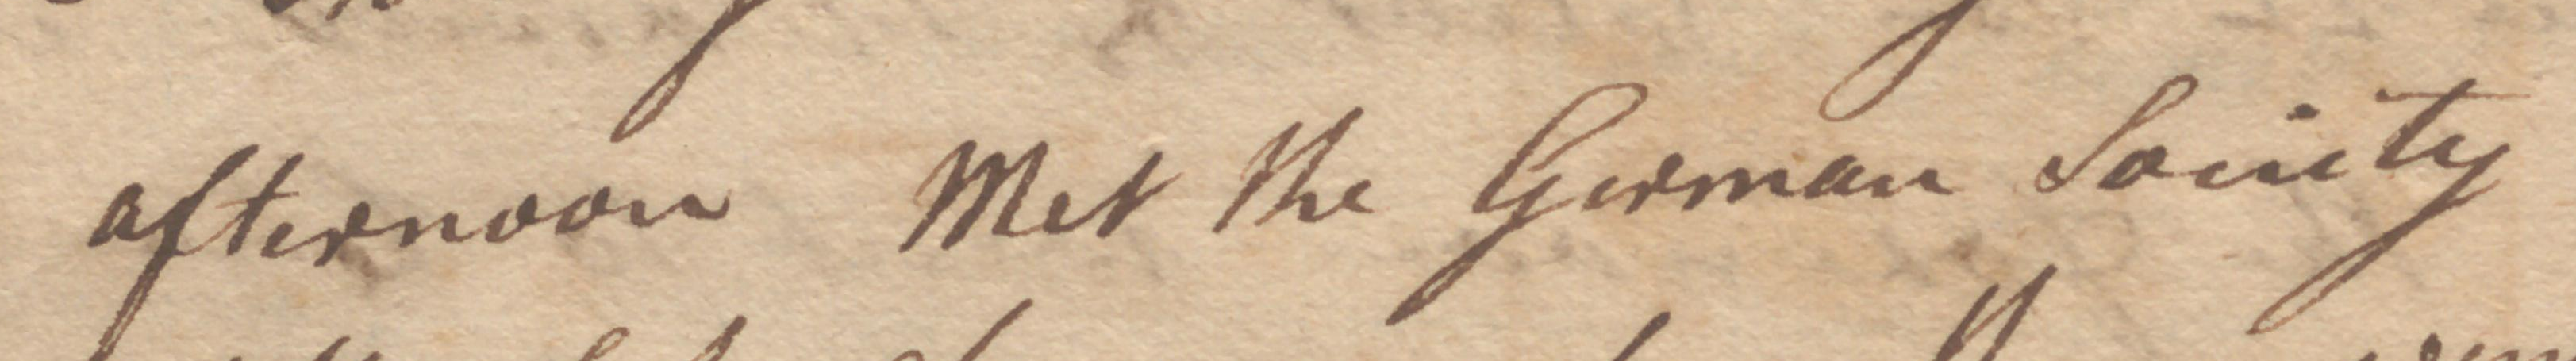afternoon Met the German Society
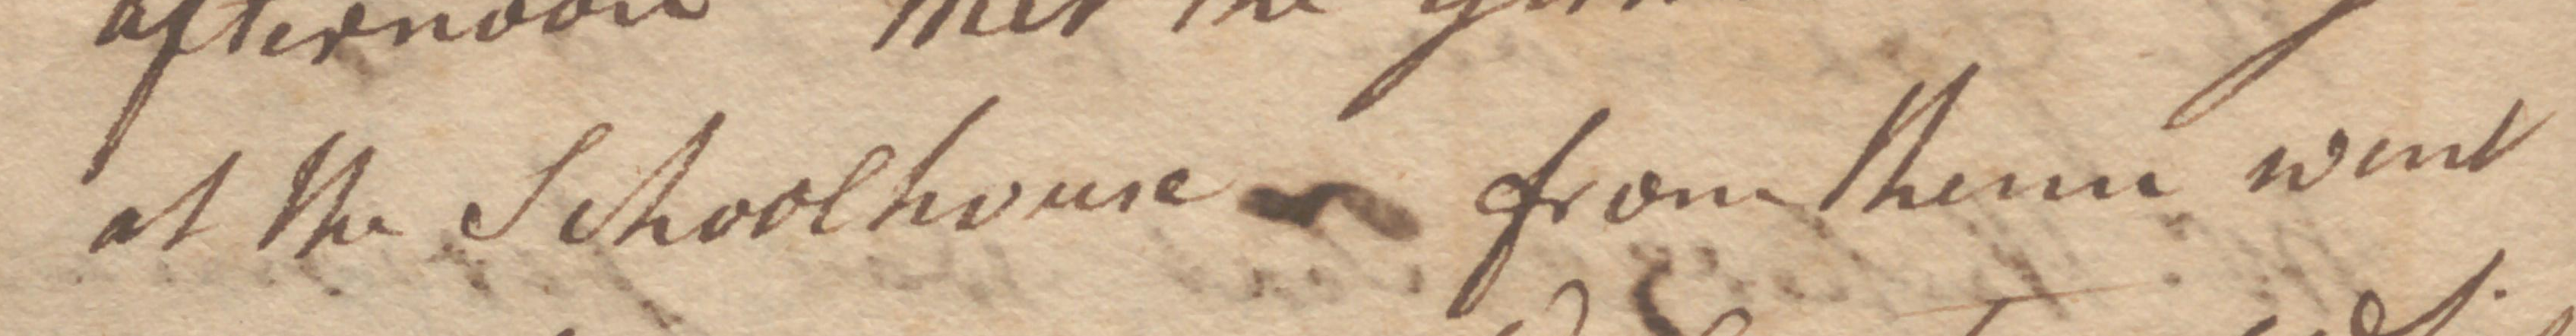at the Schoolhouse from thence went
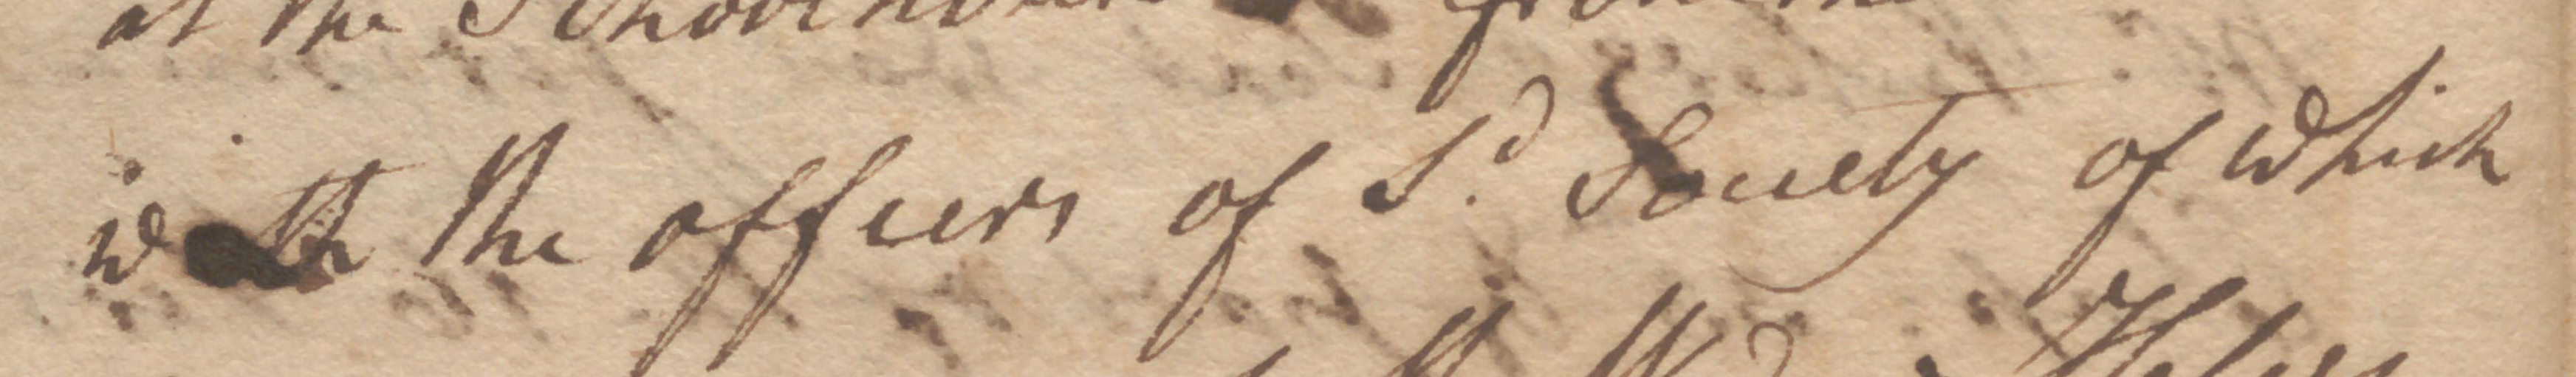with the offiers of s^d. Society of which
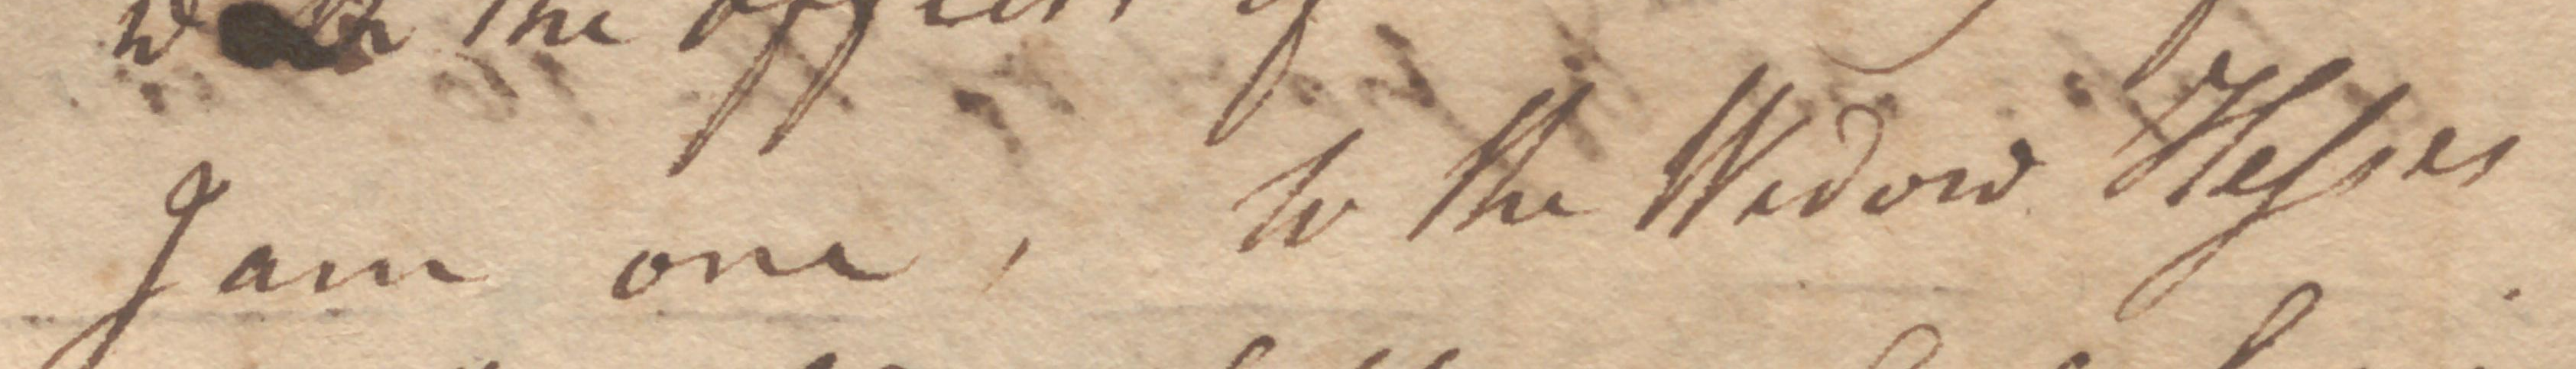I am one, to the Widow Hesses
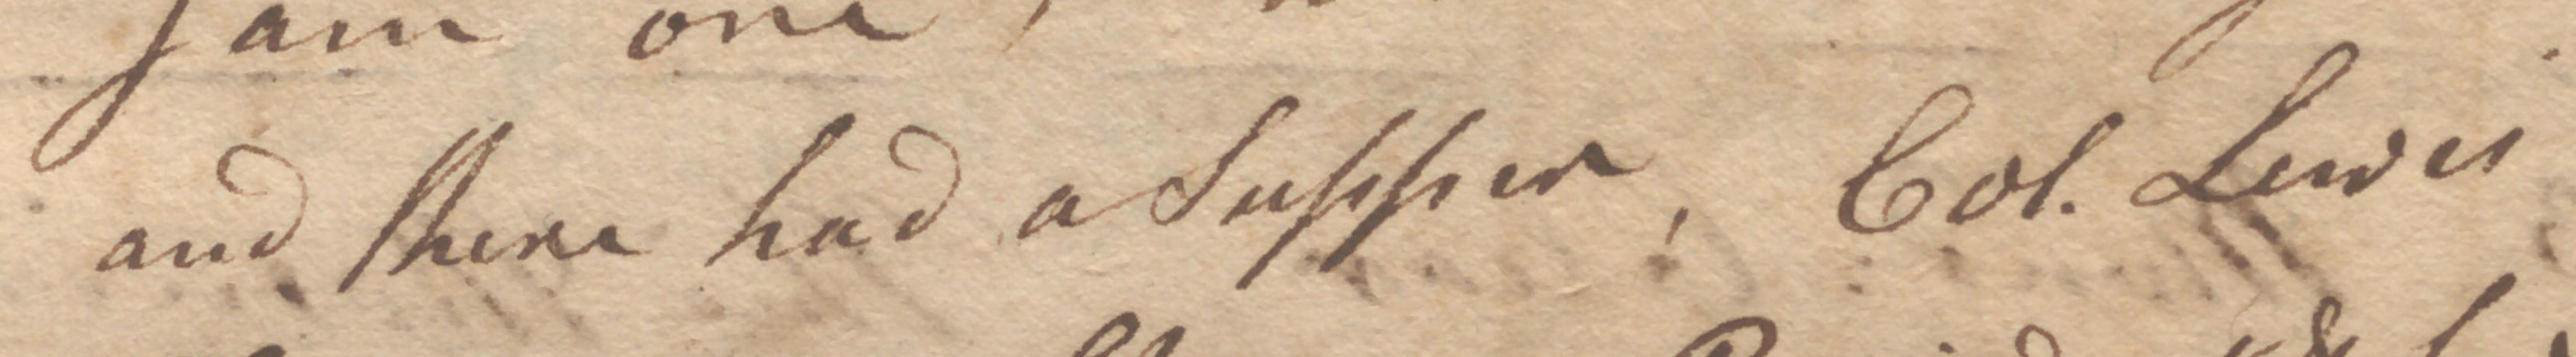and there had a Supper, Col. Lewes
